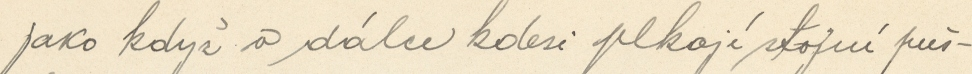jako když v dálce kdesi plkají strojní puš-
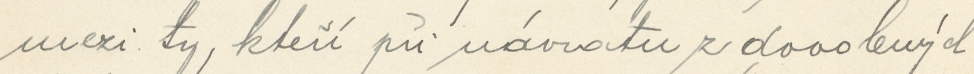mezi ty, kteří při návratu z dovolených
